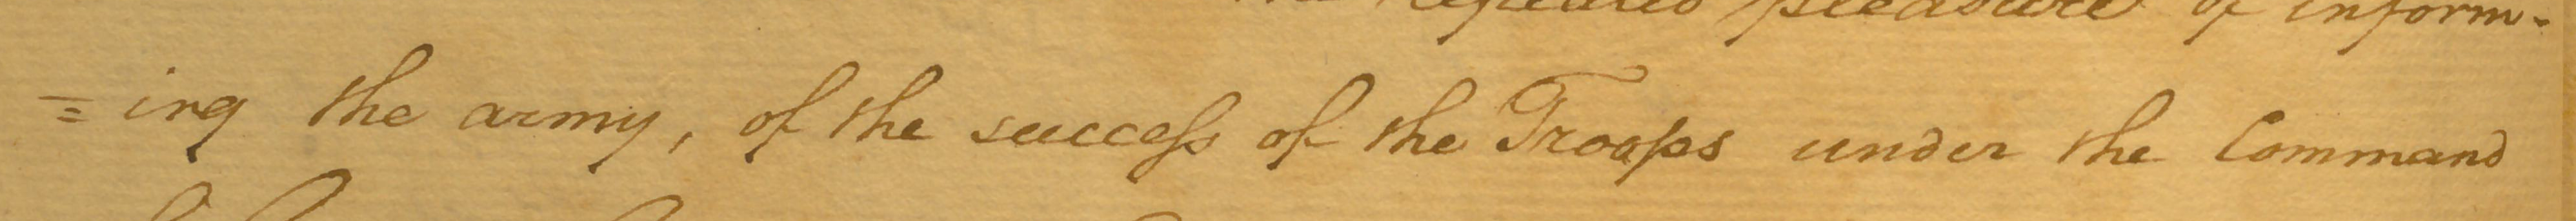-ing the army, of the success of the Troops under the Command
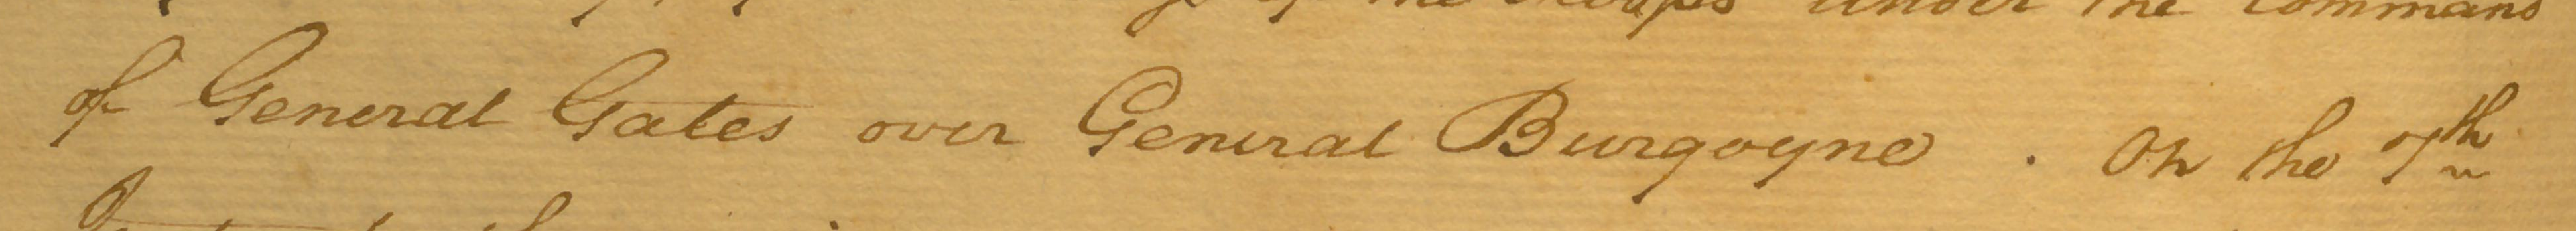of General Gates over General Burgoyne. On the 7^th
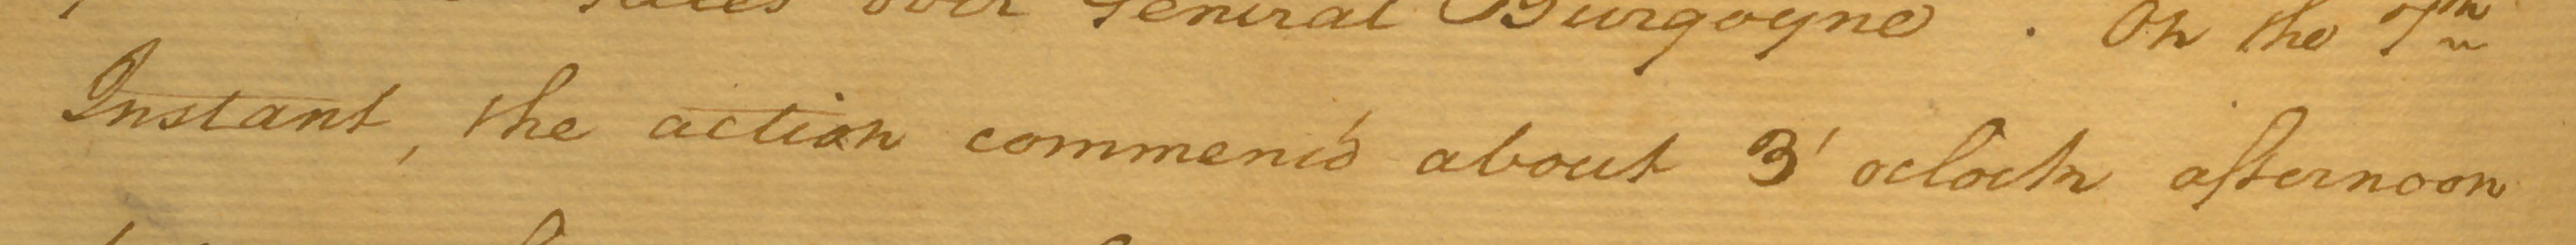Instant, the action commenc'd about 3 'oclock afternoon
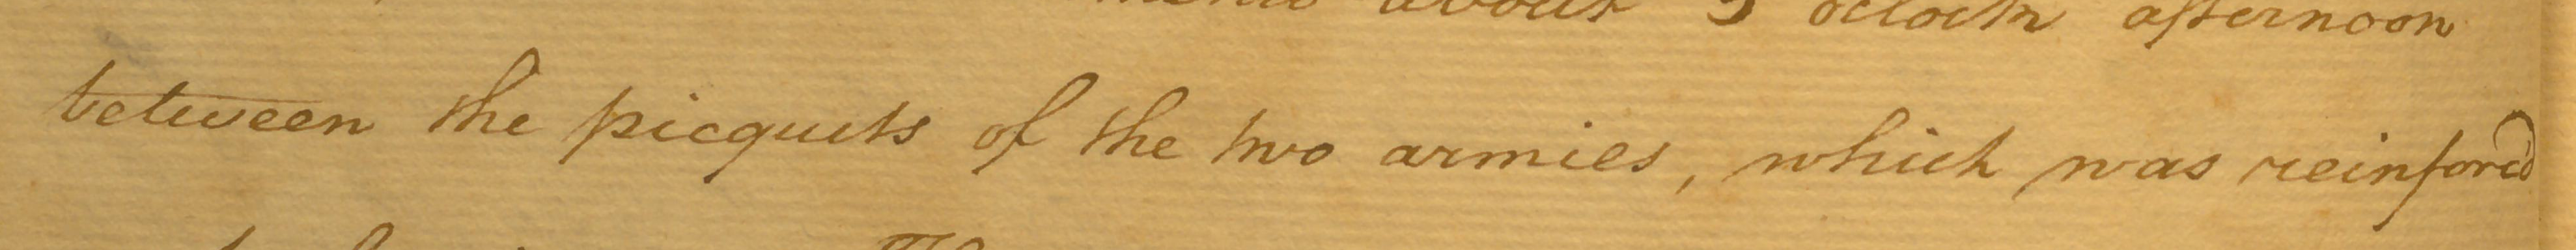between the picquets of the two armies, which was reinforc'd
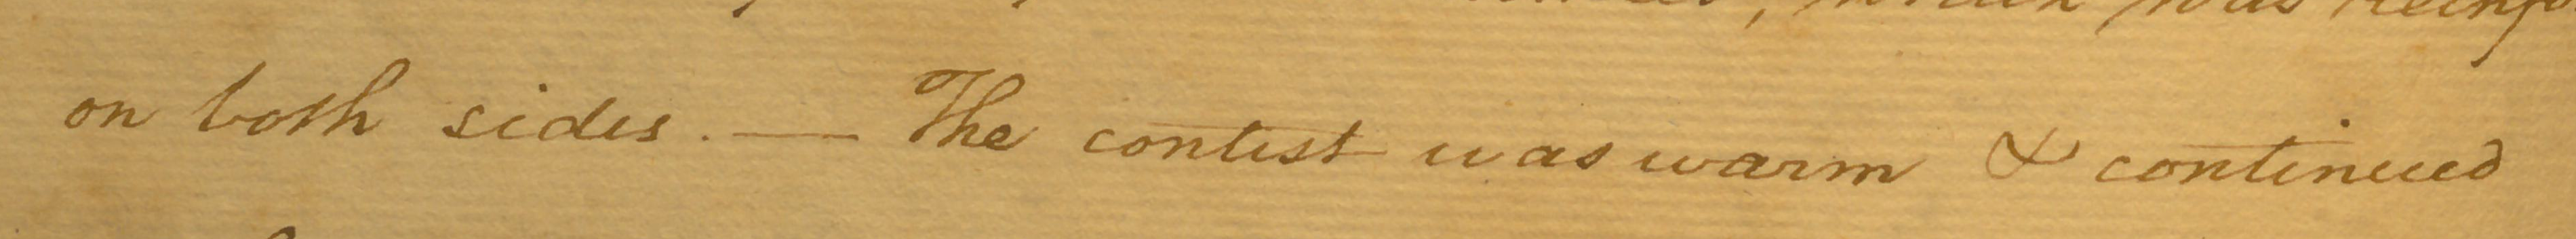on both sides.- The contest was warm & continued
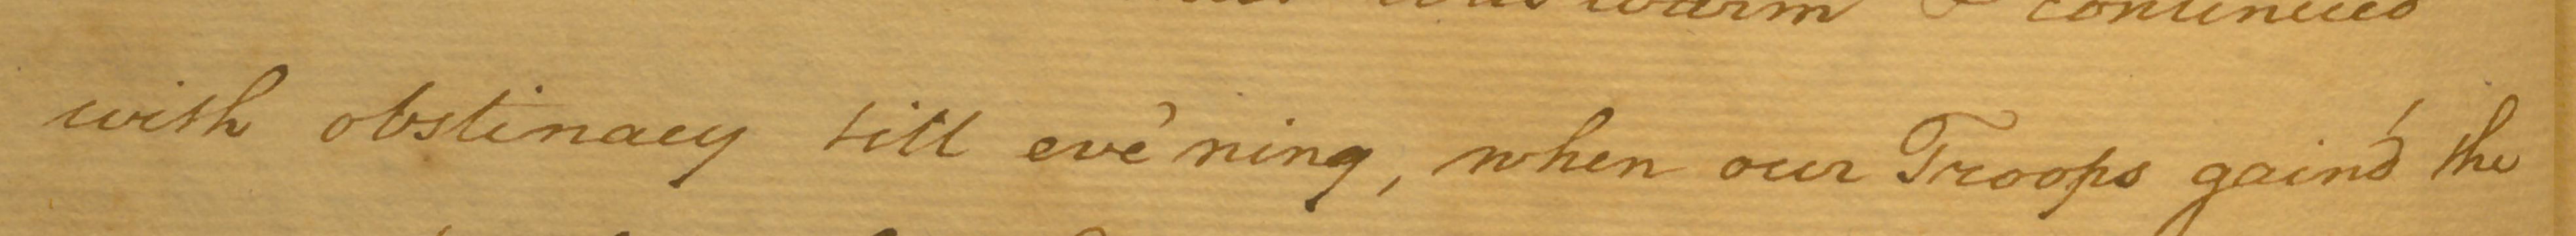with obstinacy till eve'ning, when our Troops gain'd the
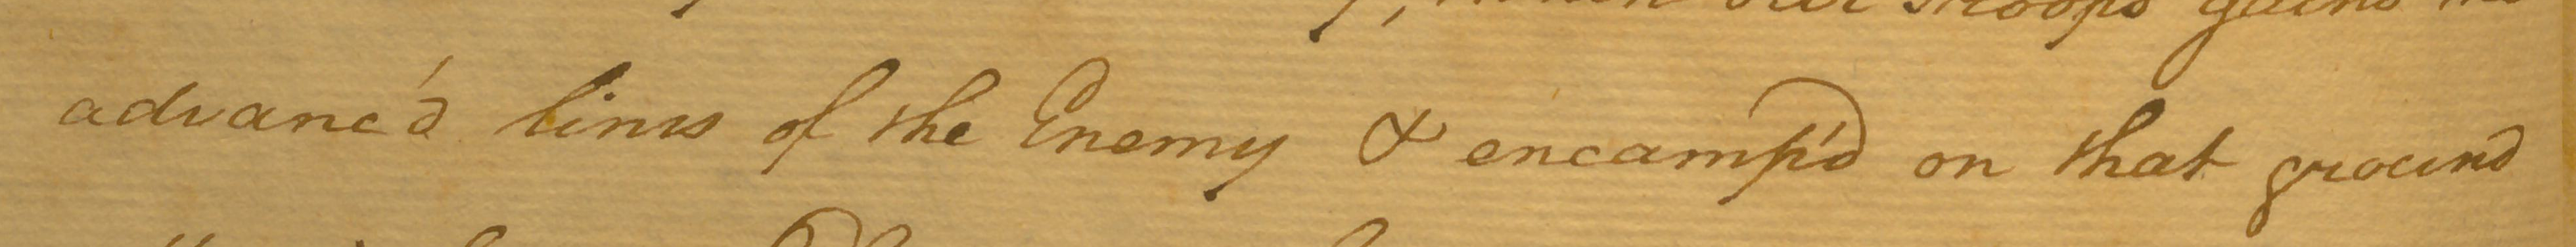advanc'd lines of the Enemy & encamp'd on that ground
